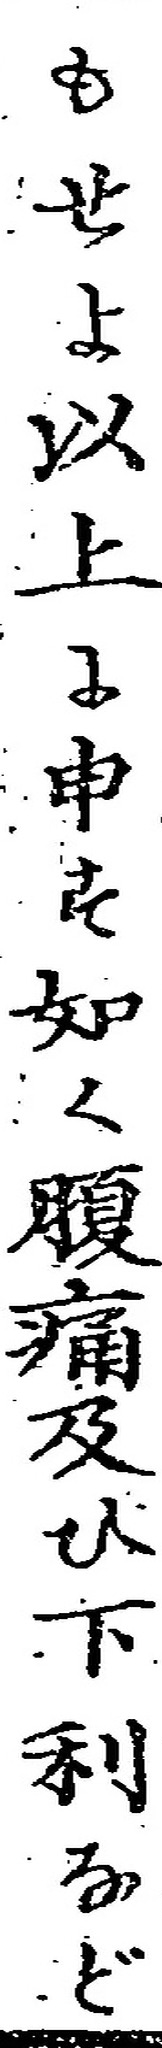もせよ以上に申す如く腹痛及ひ下利など
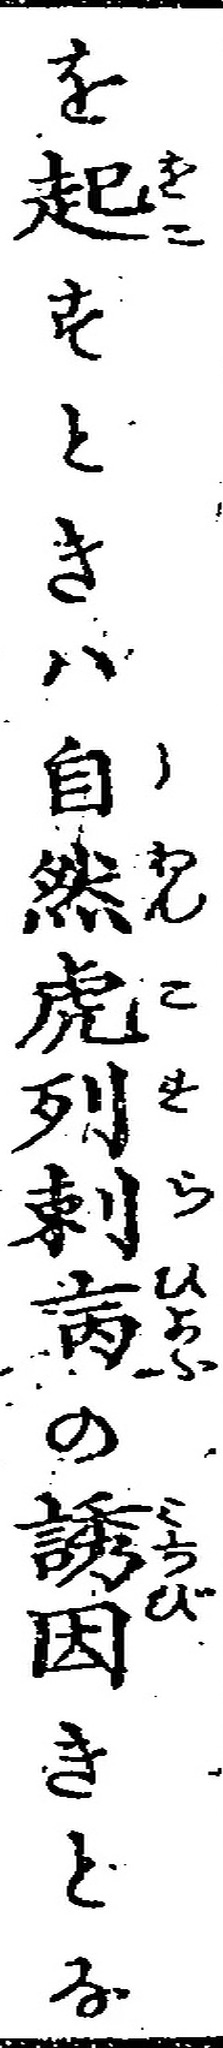を起すときは自然虎列刺病の誘因きとな
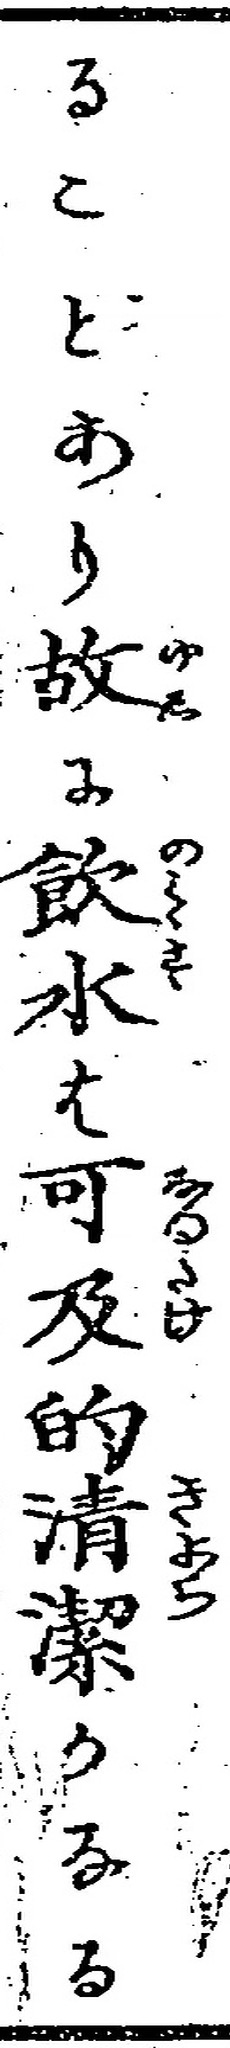ることあり故に飲水は可及的清潔かなる
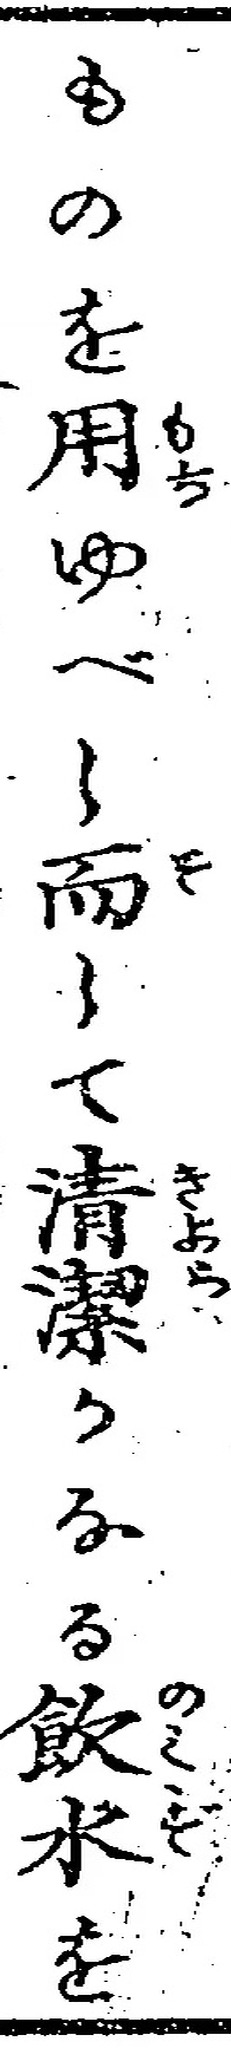ものを用ゆべし而して清潔かなる飲水を
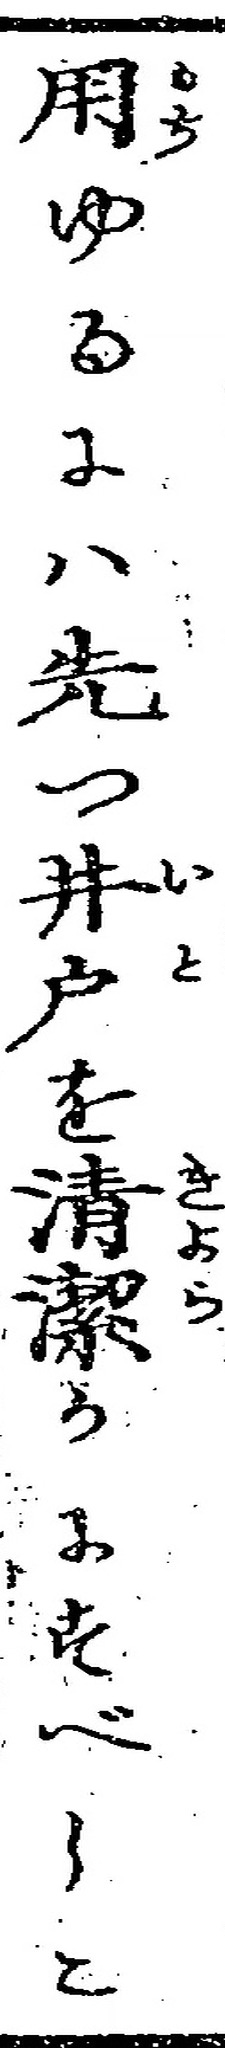用ゆるには先つ井戸を清潔かにすべしと
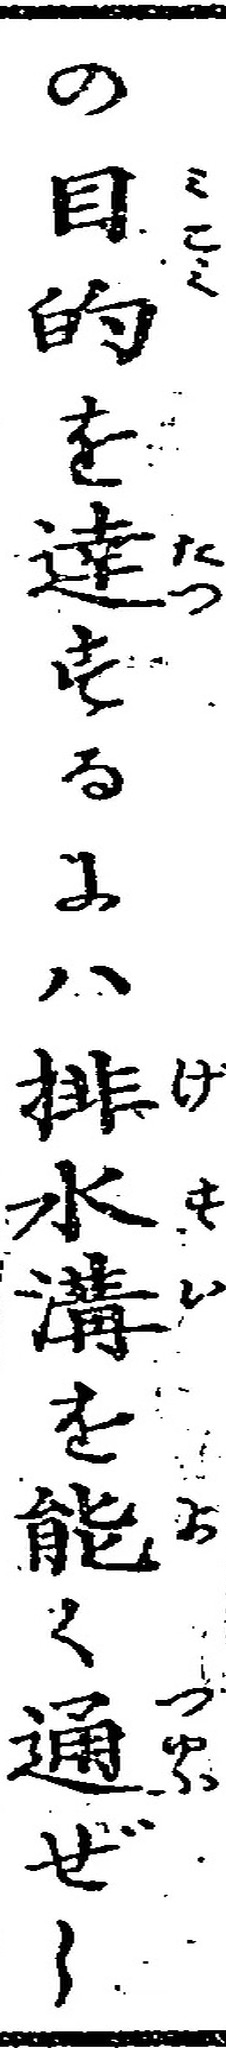の目的を達するには排水溝を能く通ぜし
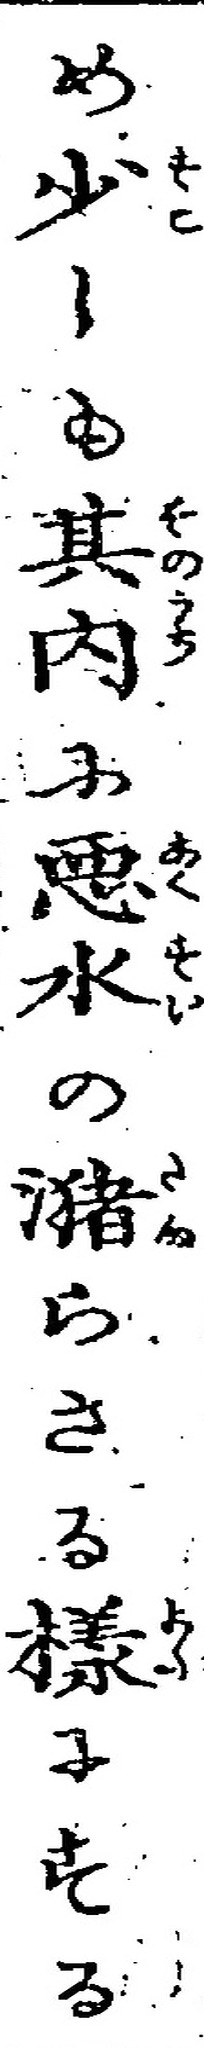め少しも其内に悪水の潴らさる様にする
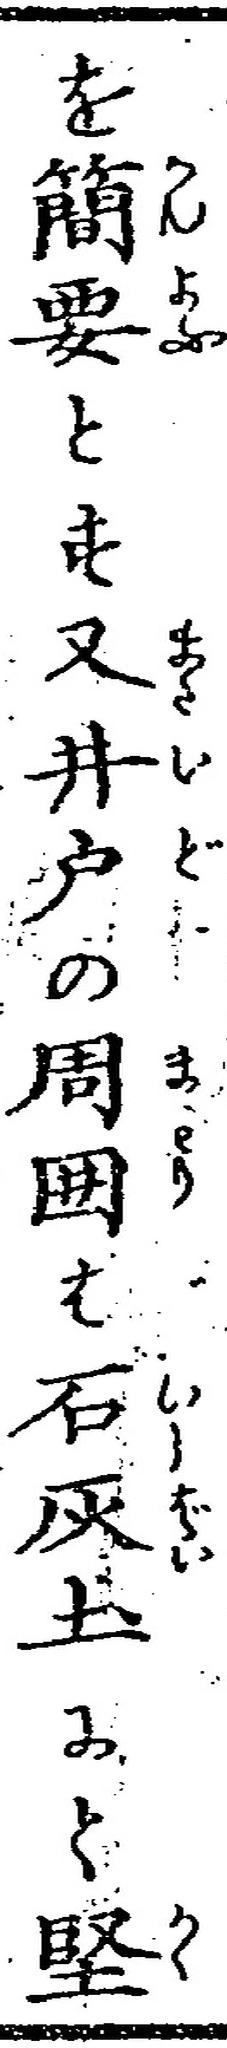を簡要とす又井戸の周囲も石灰土にし堅
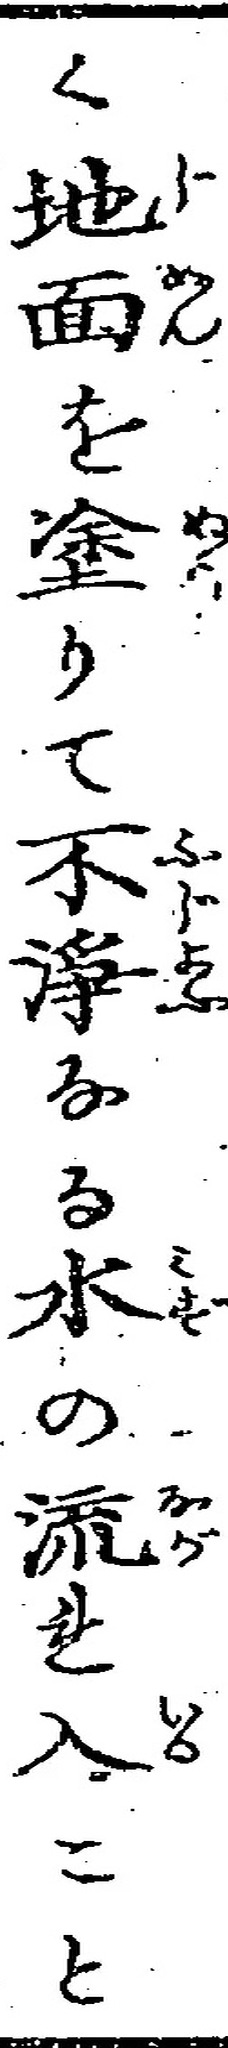く地面を塗りて不浄なる水の流れ入こと

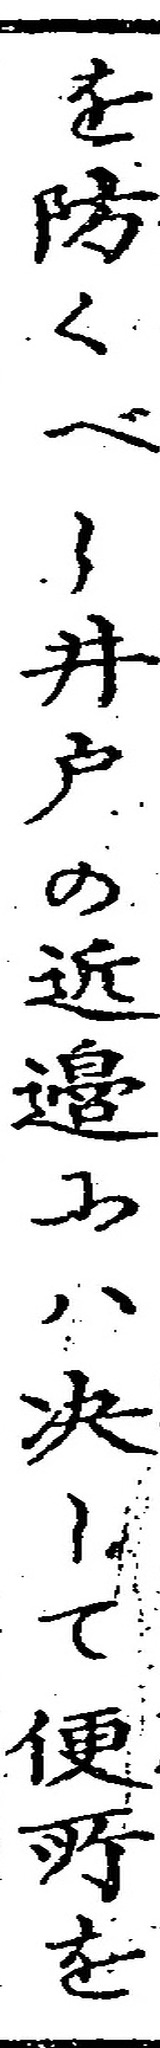を防ぐべし井戸の近辺には決して便所を
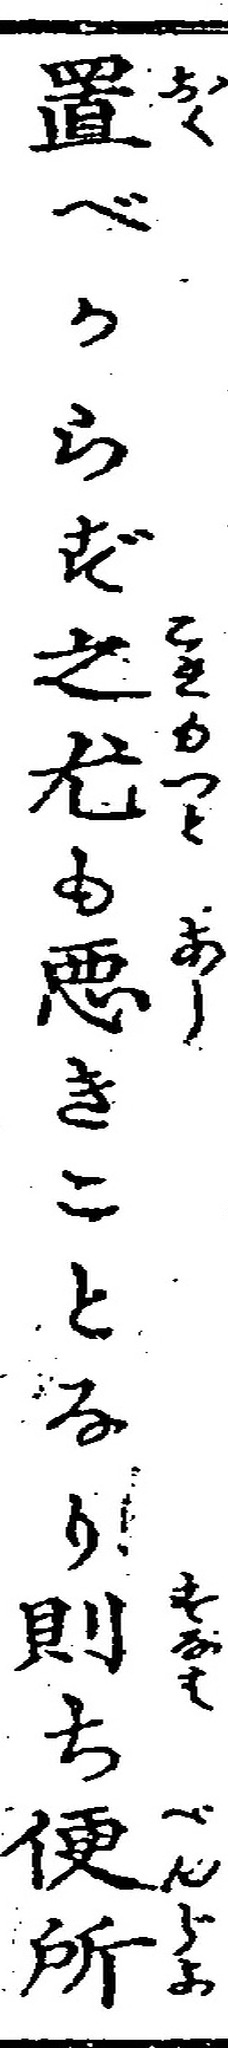置べからず之尤も悪きことなり則ち便所
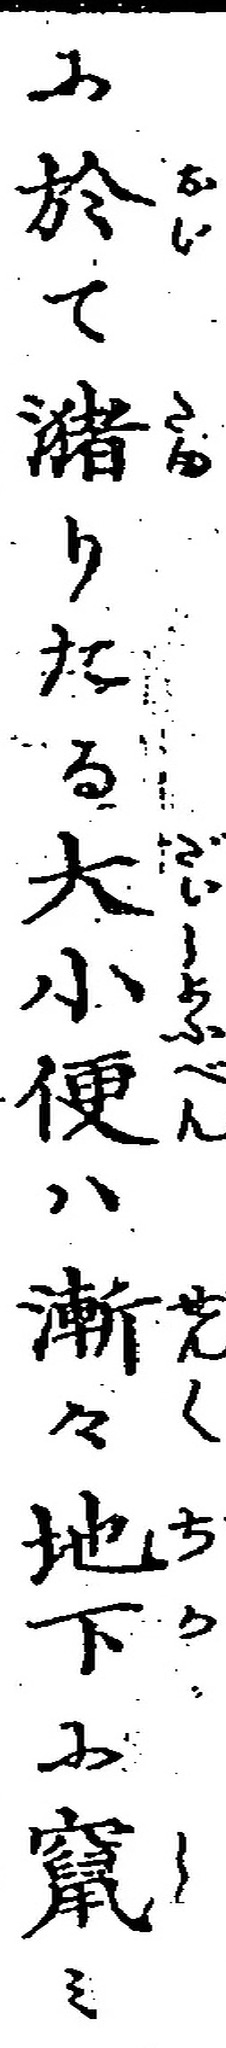に於て潴りたる大小便は漸々地下に竄み
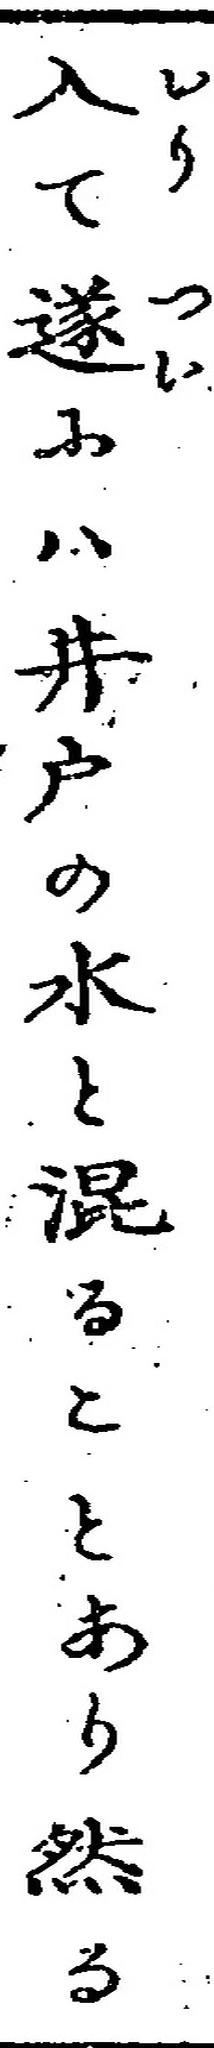入て遂には井戸の水と混ることあり然る
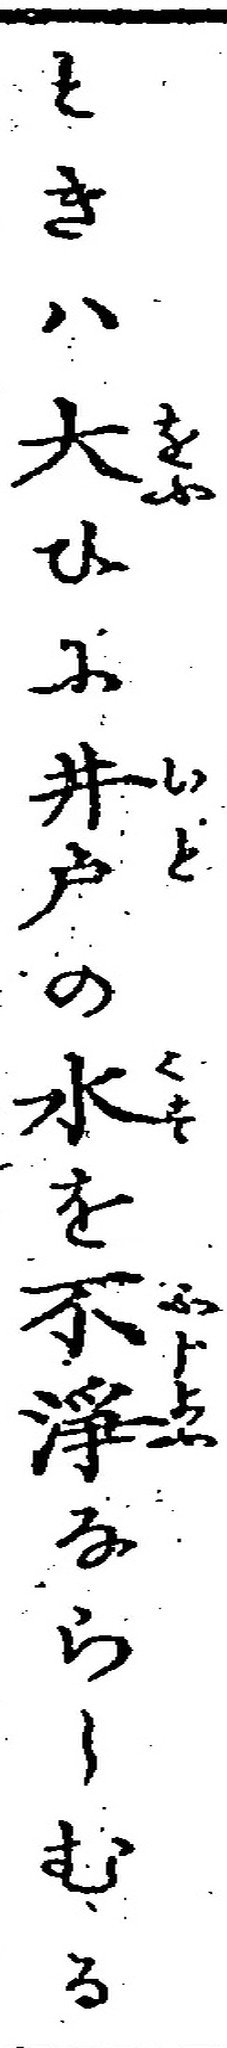ときは大ひに井戸の水を不浄ならしむる
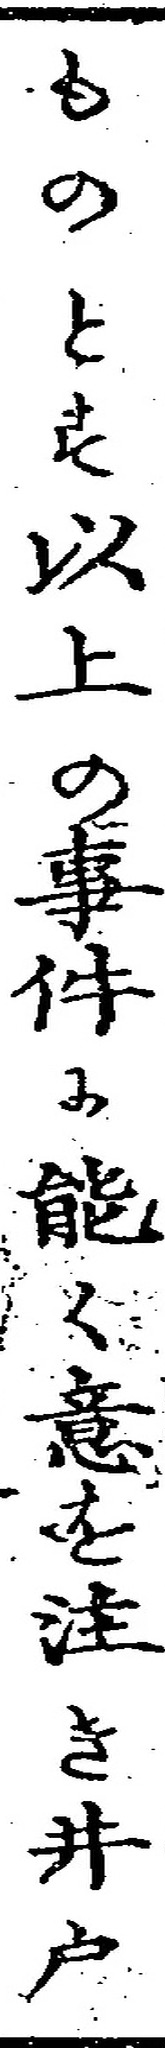ものとす以上の事件に能く意を注き井戸
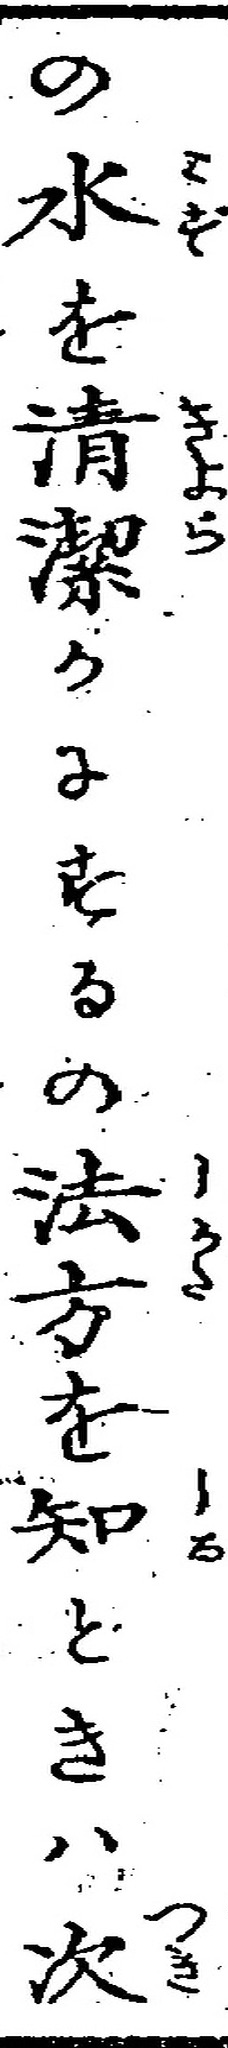の水を清潔かにするの法方を知ときは次
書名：コレラ予防命乃後見
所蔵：国立国会図書館 National Diet Library, JAPAN
